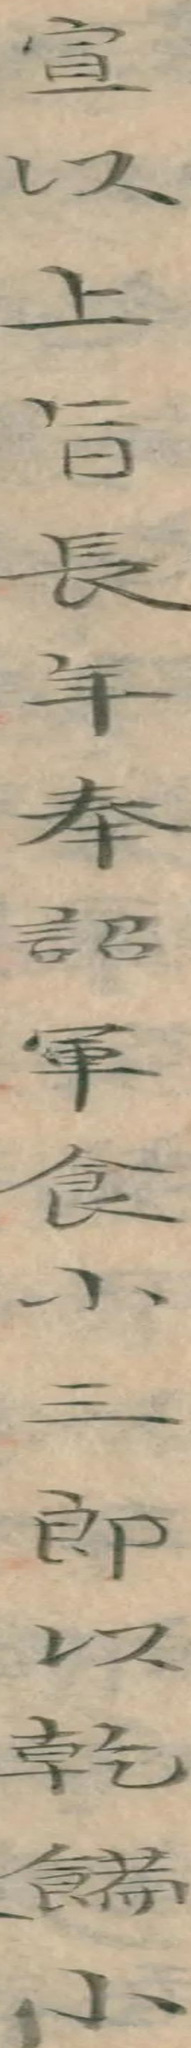宣以上旨長年奉詔軍食小三郎以乾小
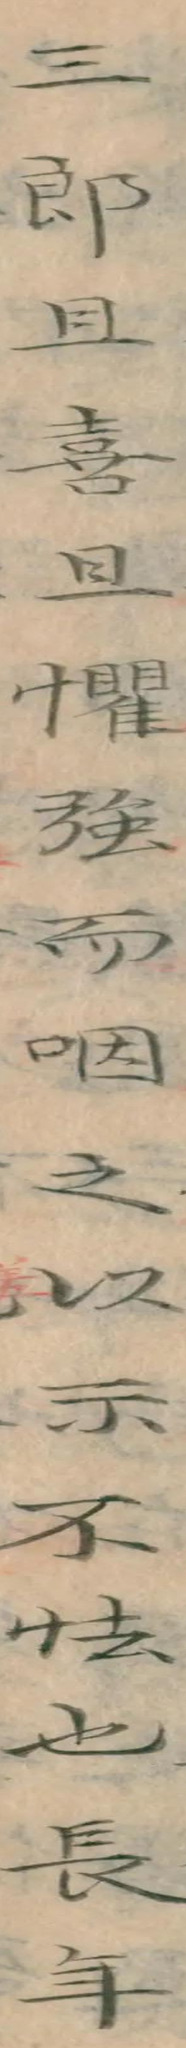三郎且喜且懼強而咽之以示不怯也長年
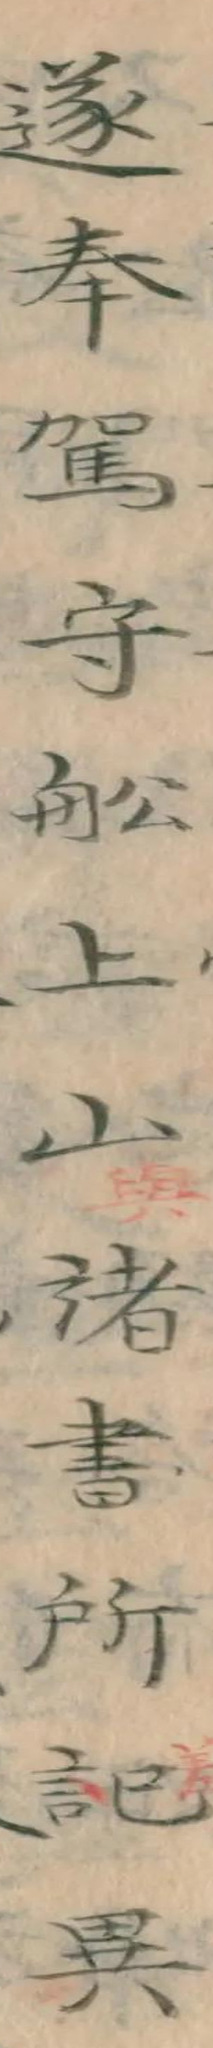遂奉駕守船上山与諸書所記差異
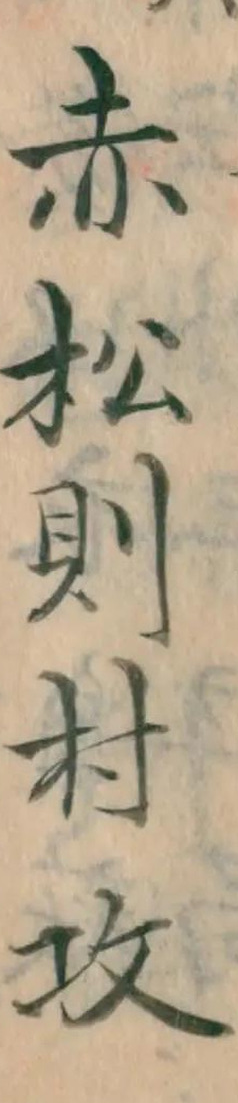赤松則村攻
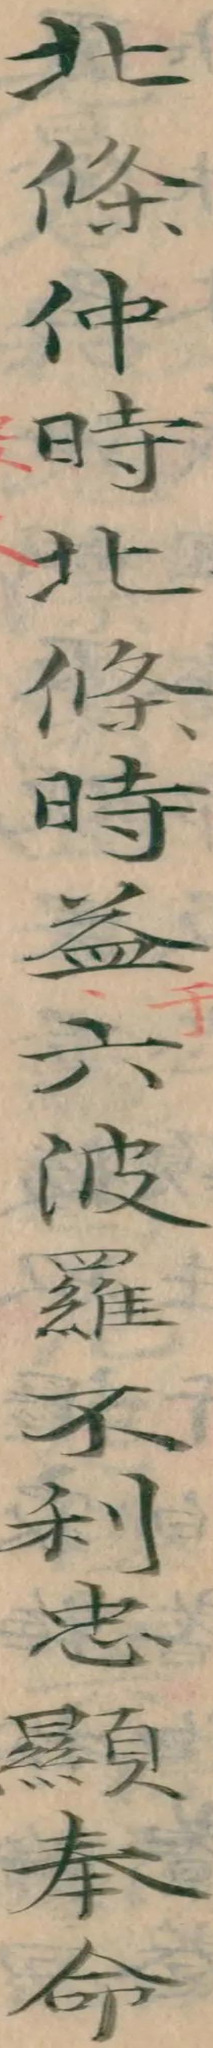北条仲時北条時益于六波羅不利忠顕奉命
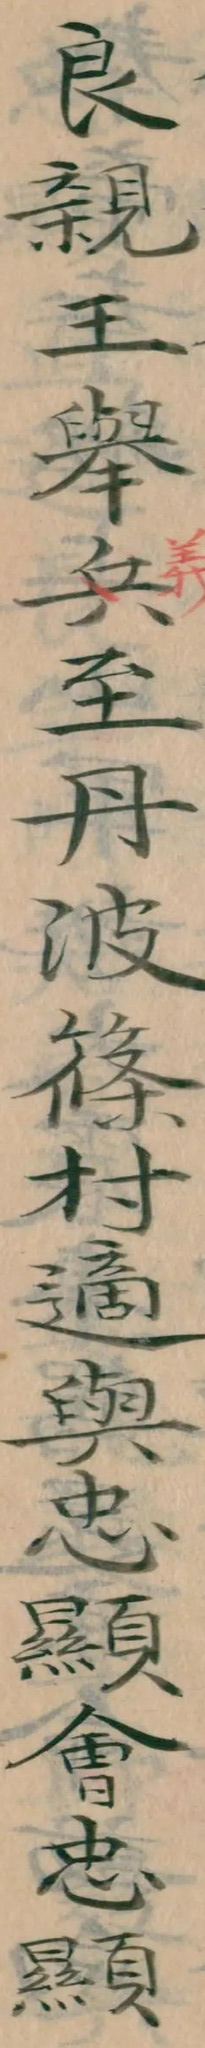良親王挙兵義至丹波篠村適与忠顕会忠顕
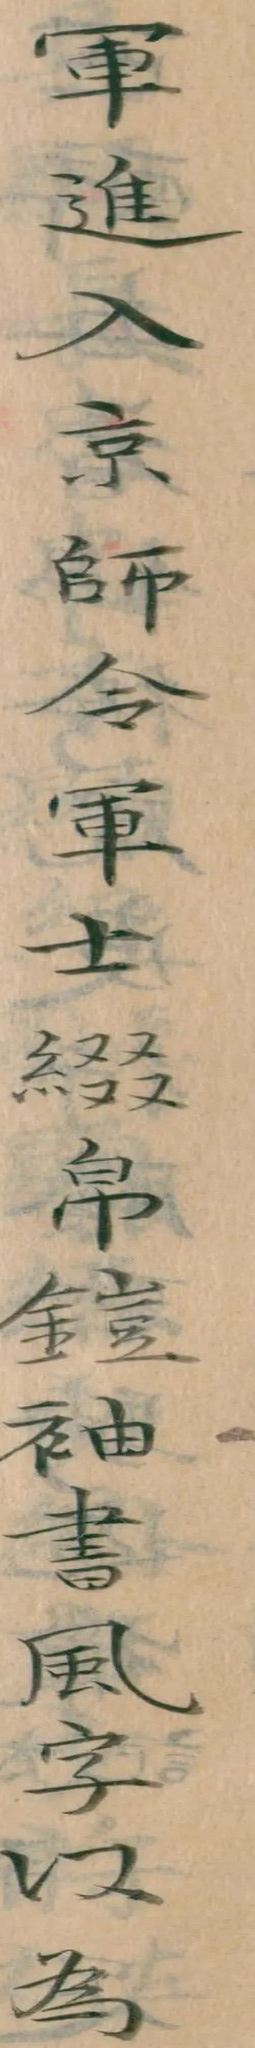軍進入京師令軍士綴帛鎧袖書風字以為
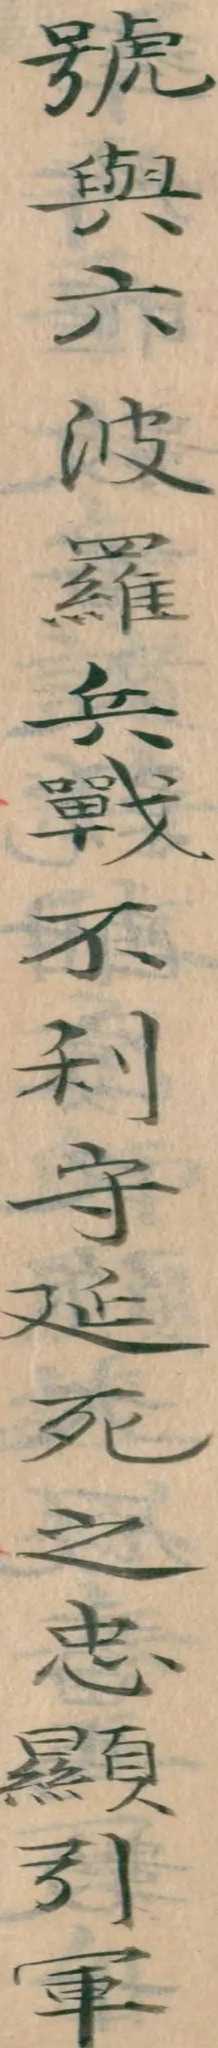号与六波羅兵戦不利守延死之忠顕引軍
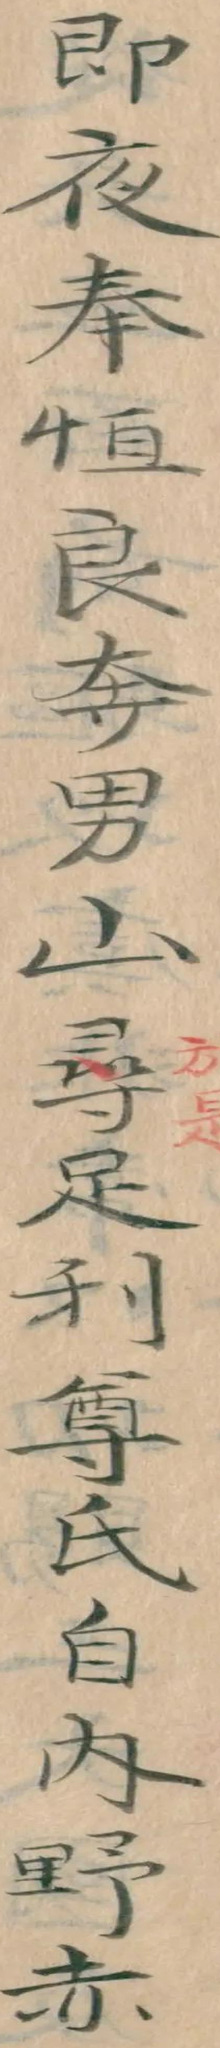即夜奉恒良奔男山尋於是足利尊氏自内野赤
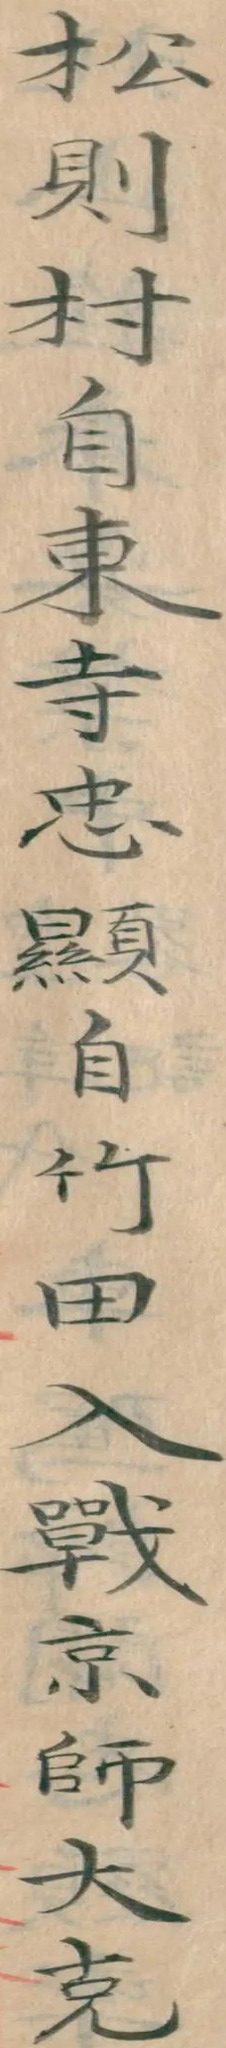松則村自東寺忠顕自竹田入戦京師大克

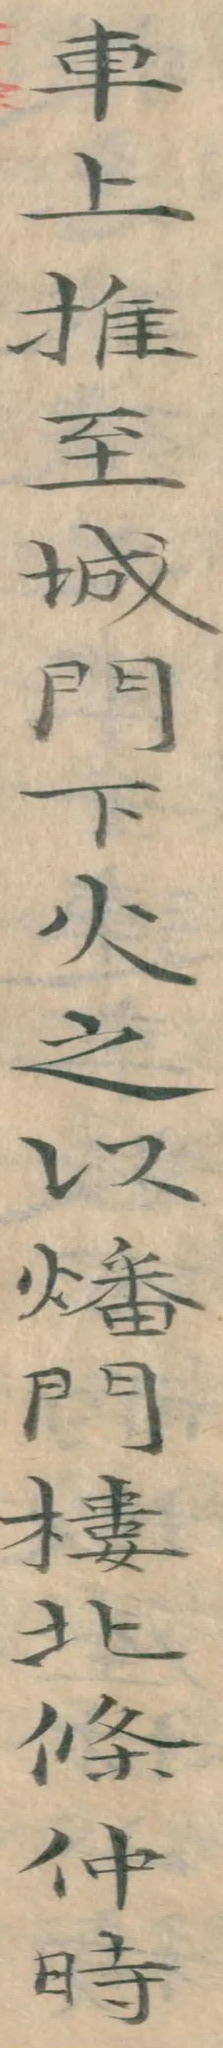車上推至城門下火之以燔門楼北条仲時
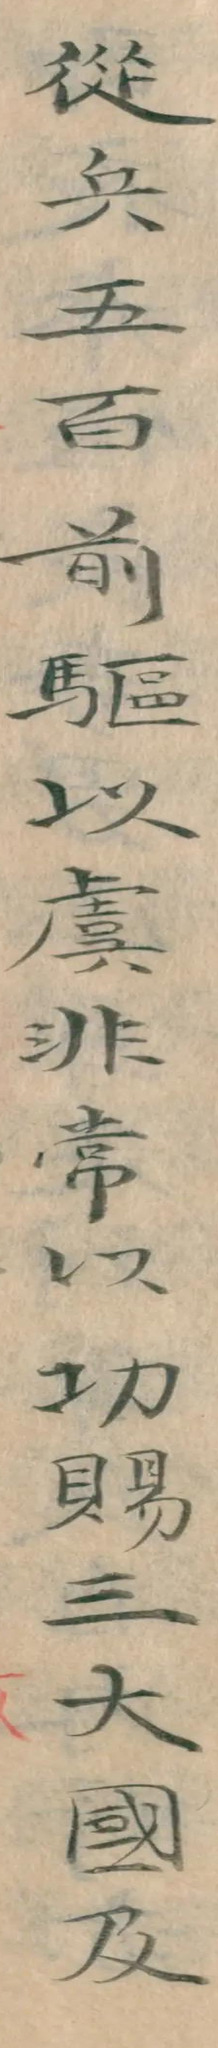従兵五百前駆以非常以功賜三大国及
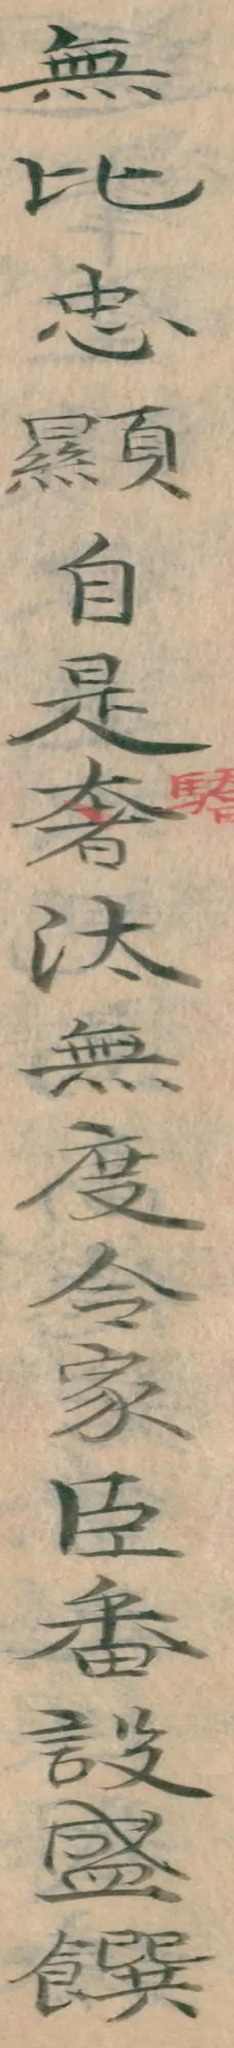無比忠顕自是奢驕汰無度令家臣番設盛饌
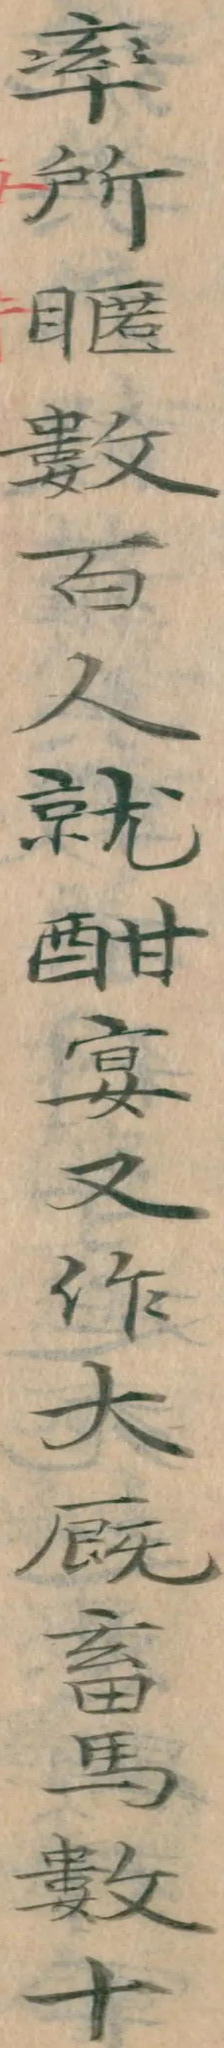率所数百人就酣宴又作大厩畜馬数十
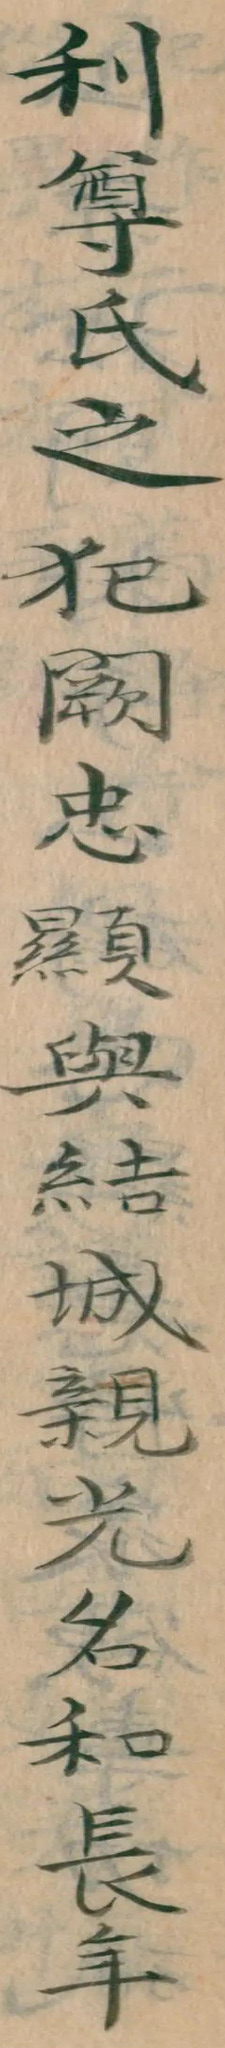利尊氏之犯闕忠顕与結城親光名和長年
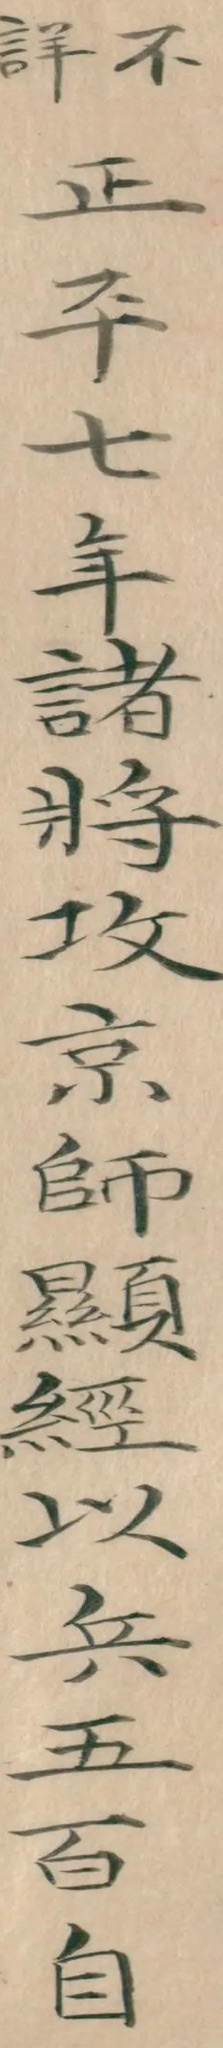不詳正平七年諸将攻京師顕経以兵五百自
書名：輪池叢書. 12
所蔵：国立国会図書館 National Diet Library, JAPAN
